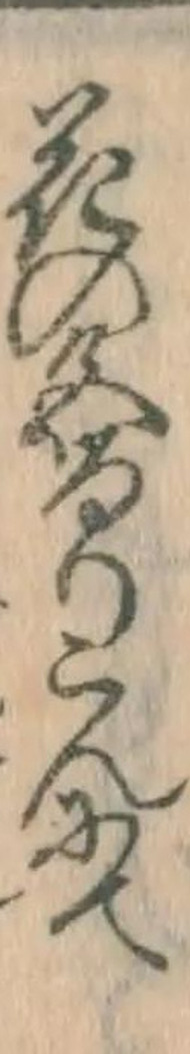花の色るりこんにて
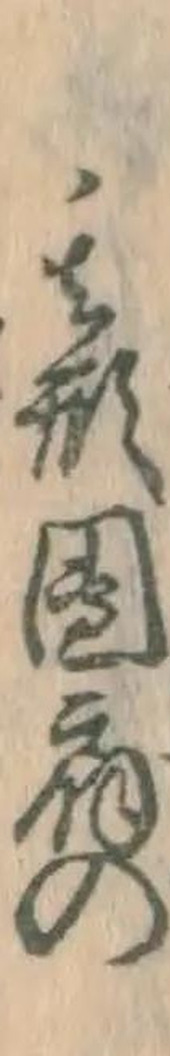其形団扇の
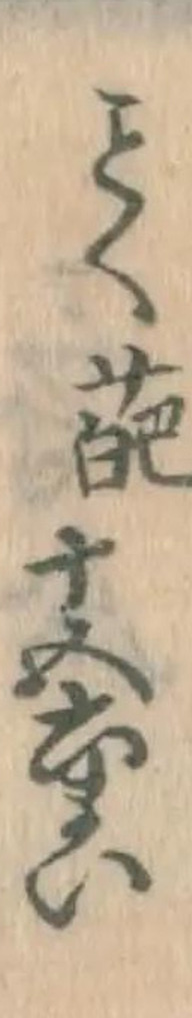ことく葩十五六まい
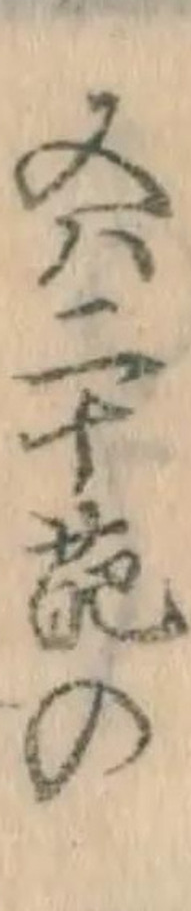又は二十葩の
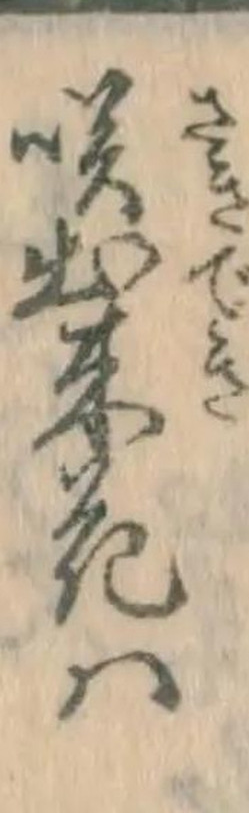咲出来花は
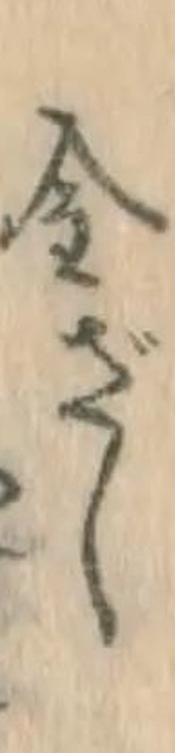金ざし
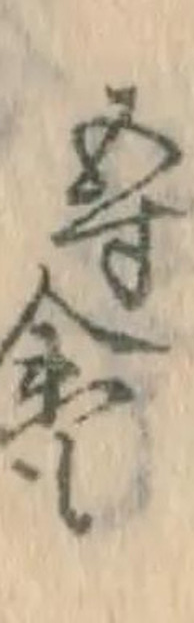五寸余も
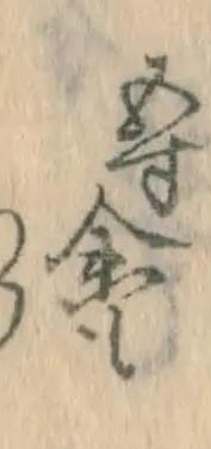五寸余も
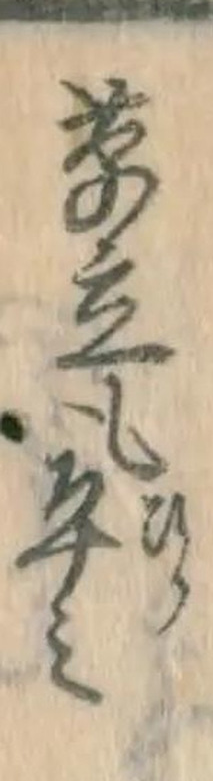草立も平み
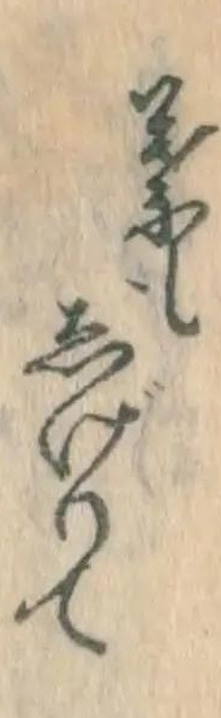しげりて
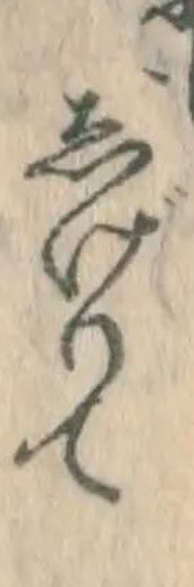しげりて
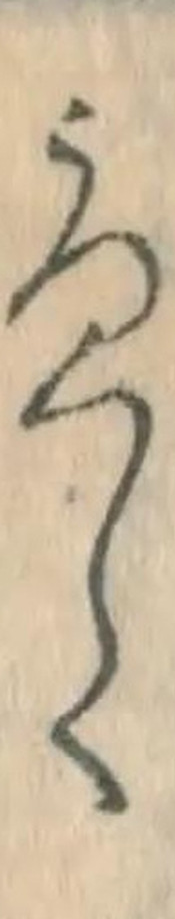うつくしく

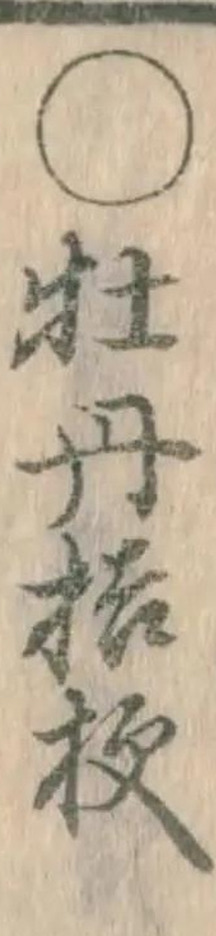〇牡丹桔梗
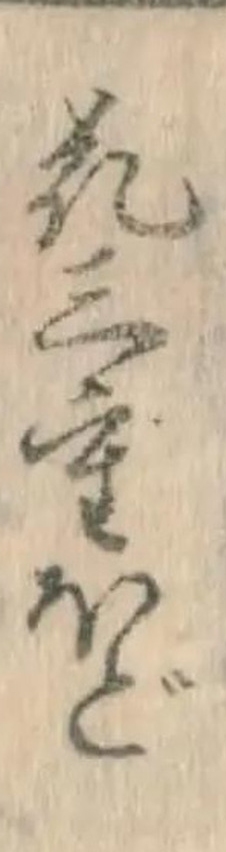花三重ほど
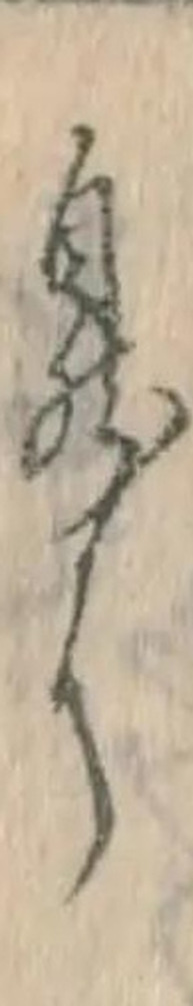自然に
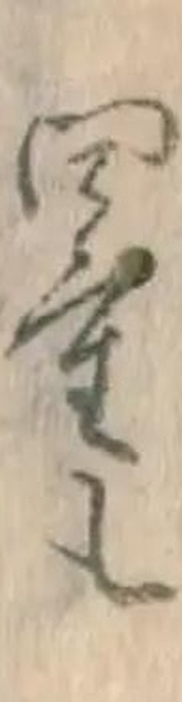四重も
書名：艸花繪前集. [3]
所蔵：国立国会図書館 National Diet Library, JAPAN
